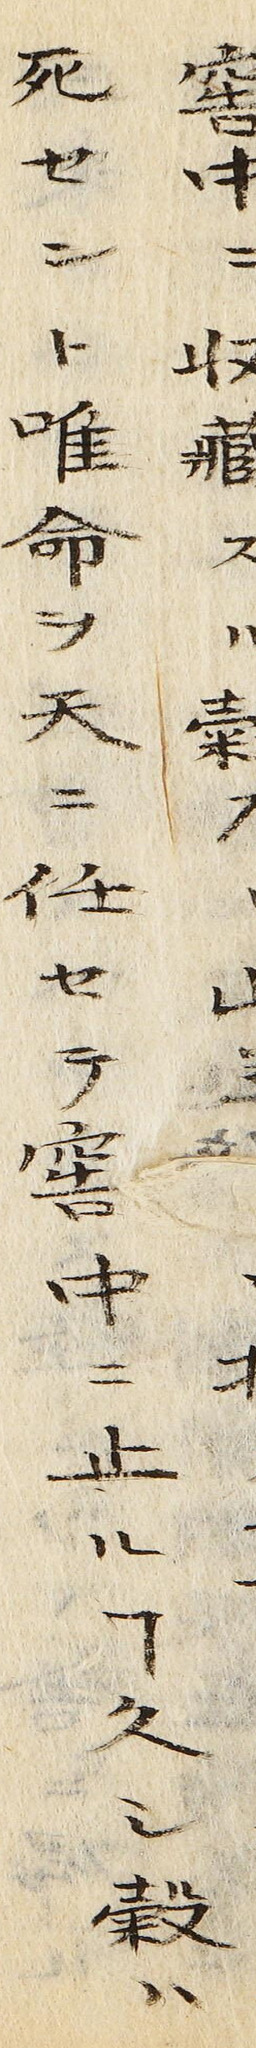死セント唯命ヲ天ニ任セテ窖中ニ止ルコト久シ穀ハ
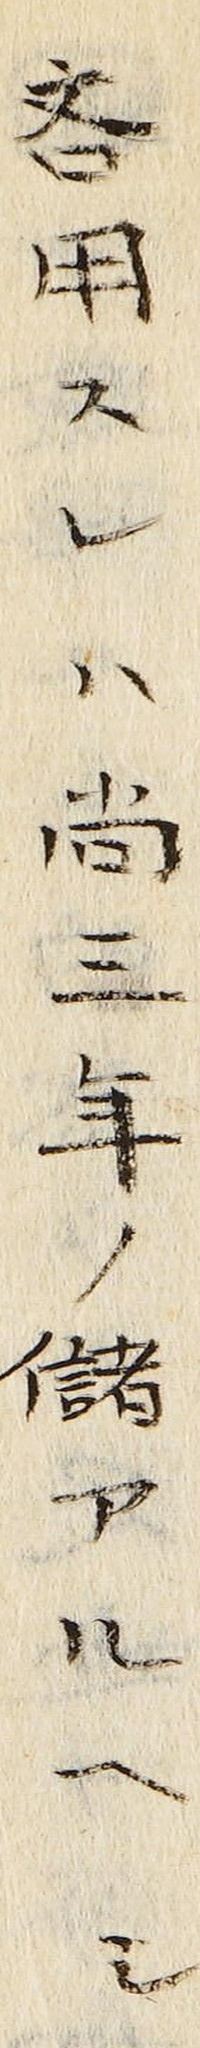吝用スレハ尚三年ノ儲アルヘシ
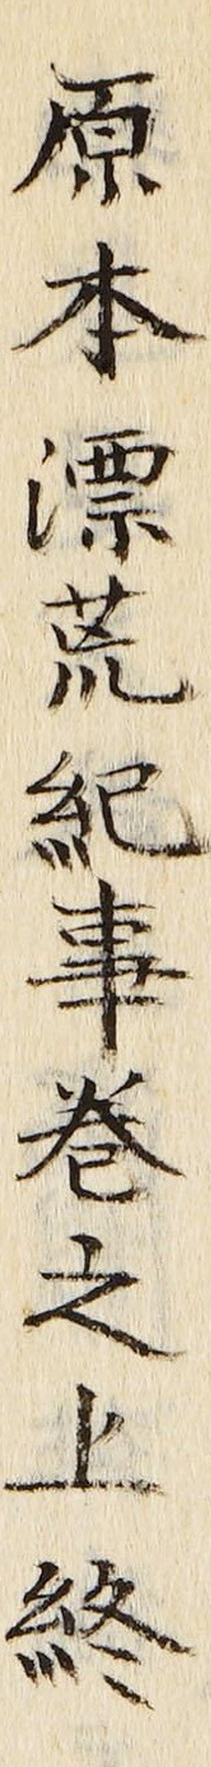原本漂荒紀事巻之上終
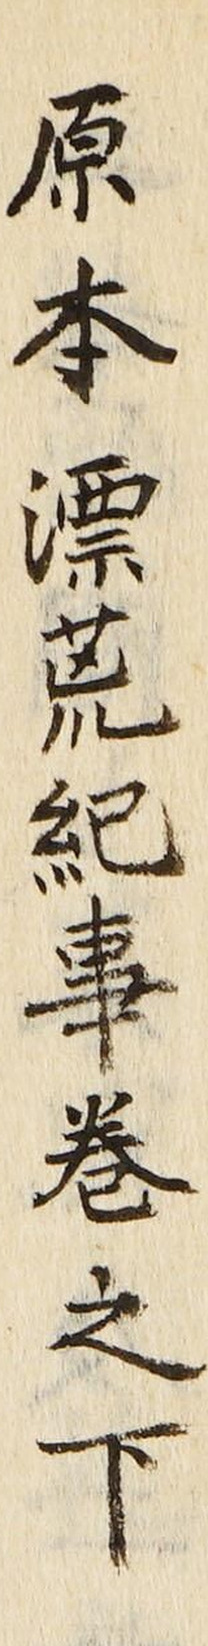原本漂荒紀事巻之下
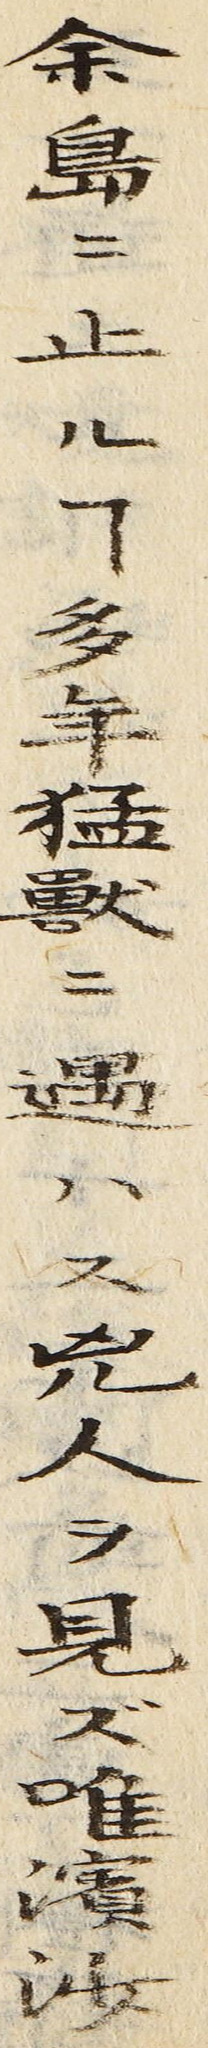余島ニ止ルコト多年猛獣ニ遇ハス兇人ヲ見ズ唯浜沙
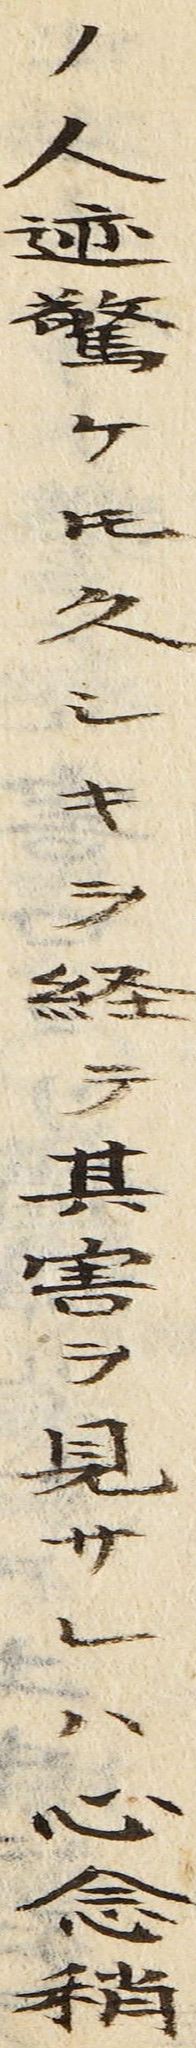ノ人迹驚ケトモ久シキヲ経テ其害ヲ見サレハ心念稍
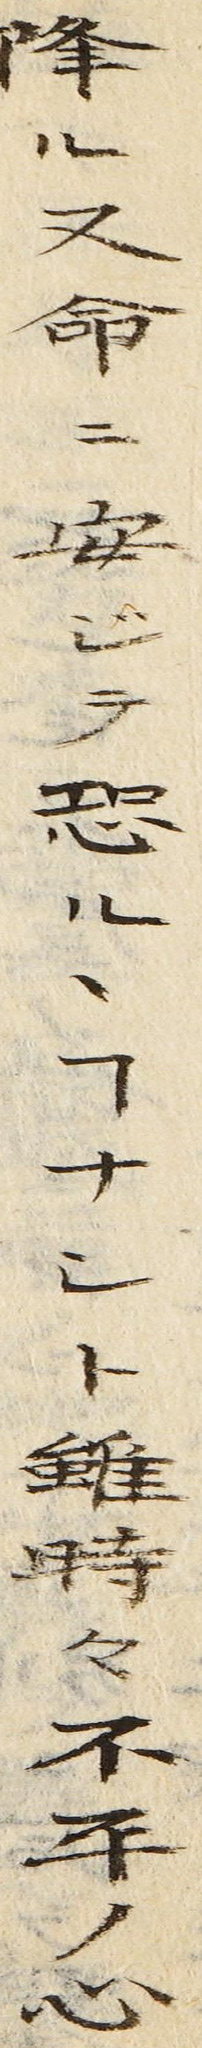降ル又命ニ安ジテ恐ルヽコトナシト雖時々不平ノ心
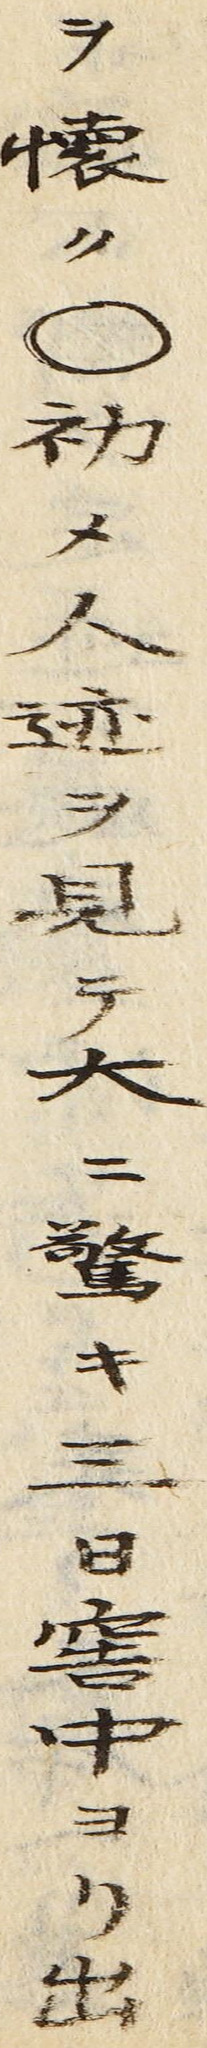ヲ懐ク◯初メ人迹ヲ見テ大ニ驚キ三日窖中ヨリ出
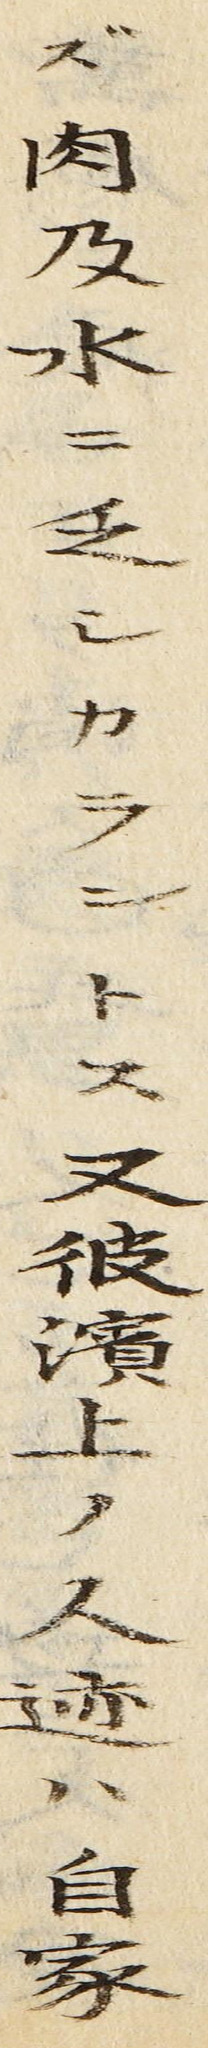ズ肉及水ニ乏シカラントス又彼浜上ノ人迹ハ自家
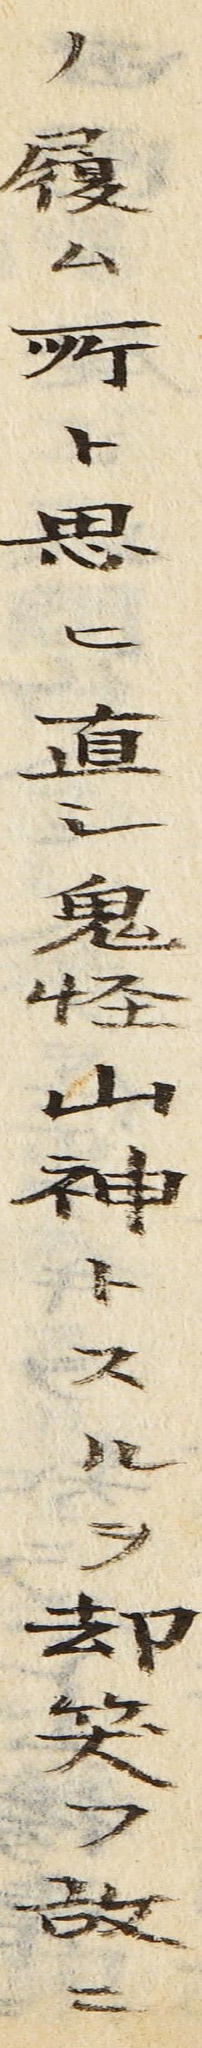ノ履ム所ト思ヒ直シ鬼怪山神トスルヲ却笑フ故ニ
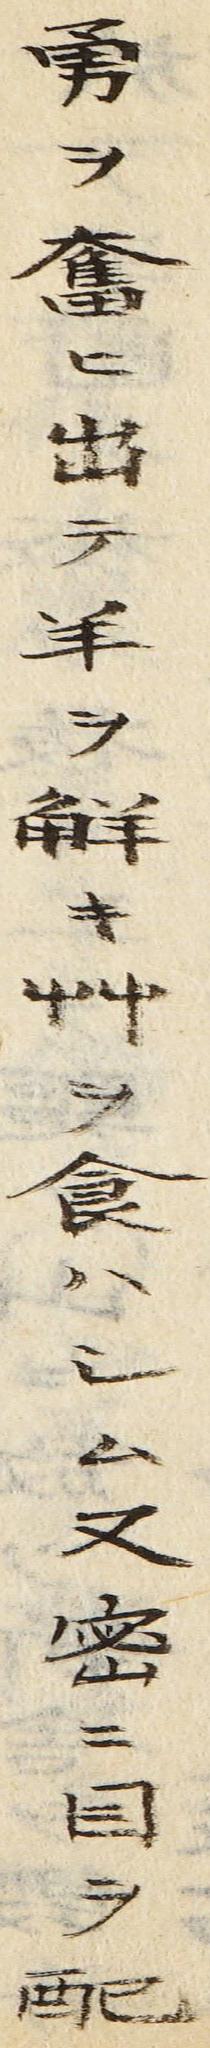勇ヲ奮ヒ出テ羊ヲ解キ艸ヲ食ハシム又密ニ目ヲ配
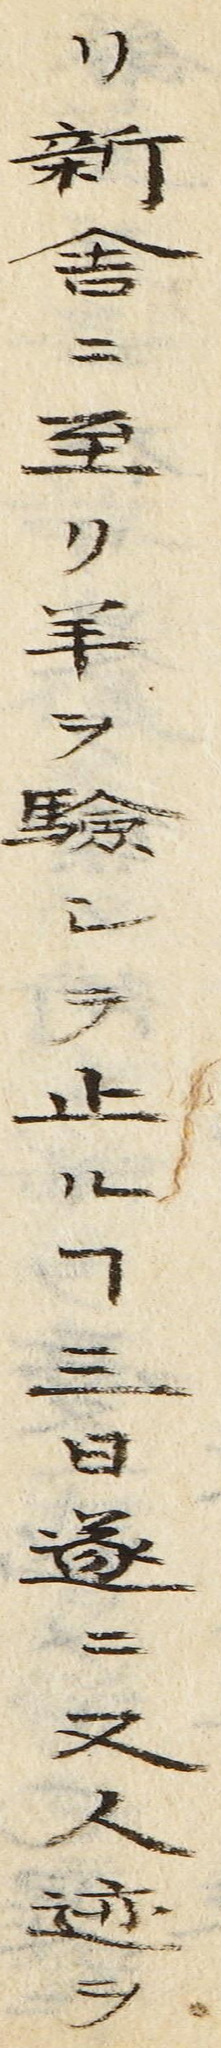リ新舎ニ至リ羊ヲ験シテ止ルコト三日遂ニ又人迹ヲ
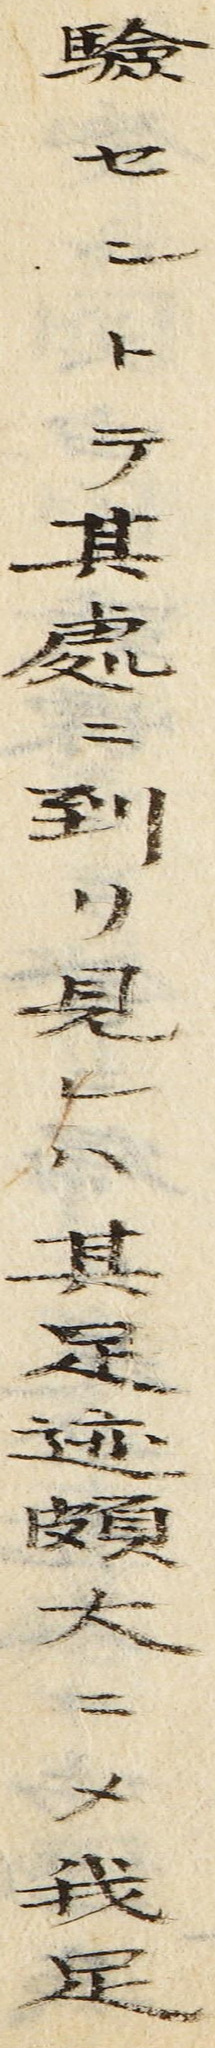験セントテ其処ニ到リ見レハ其足迹頗大ニシテ我足

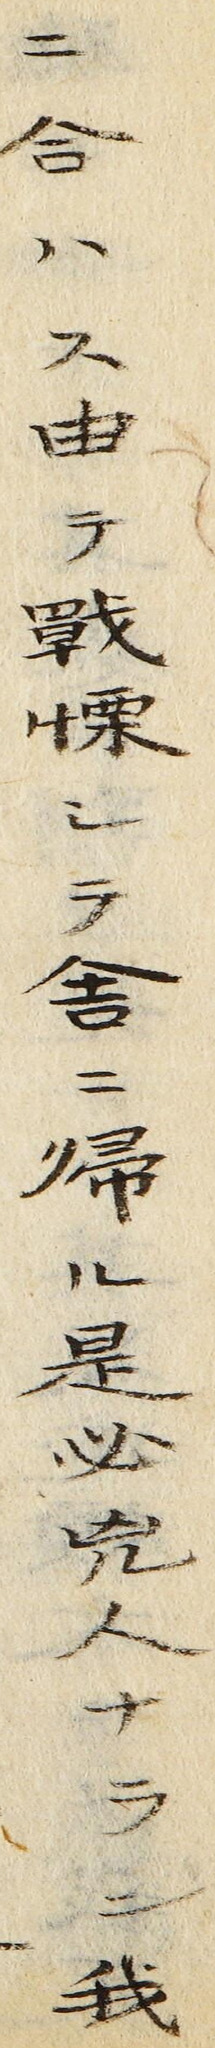ニ合ハス由テ戦慄シテ舎ニ帰ル是必兇人ナラン我
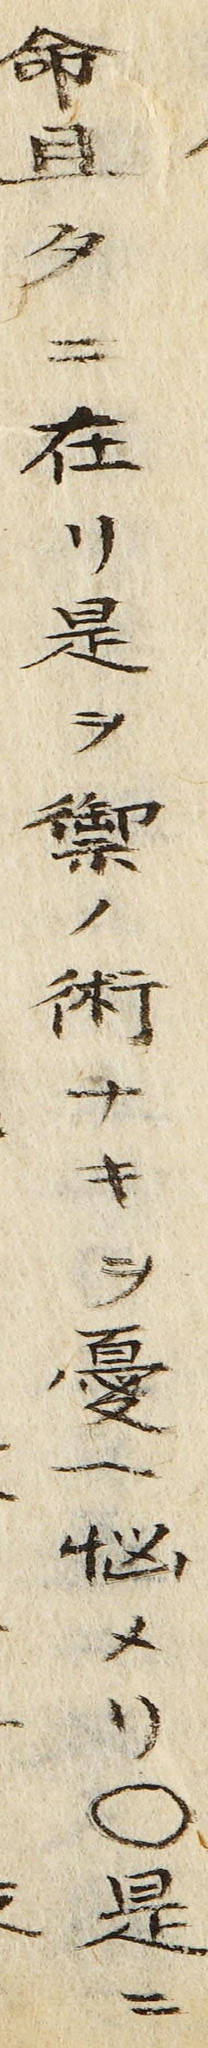命旦夕ニ在リ是ヲ禦ノ術ナキヲ憂ヘ悩メリ◯是ニ
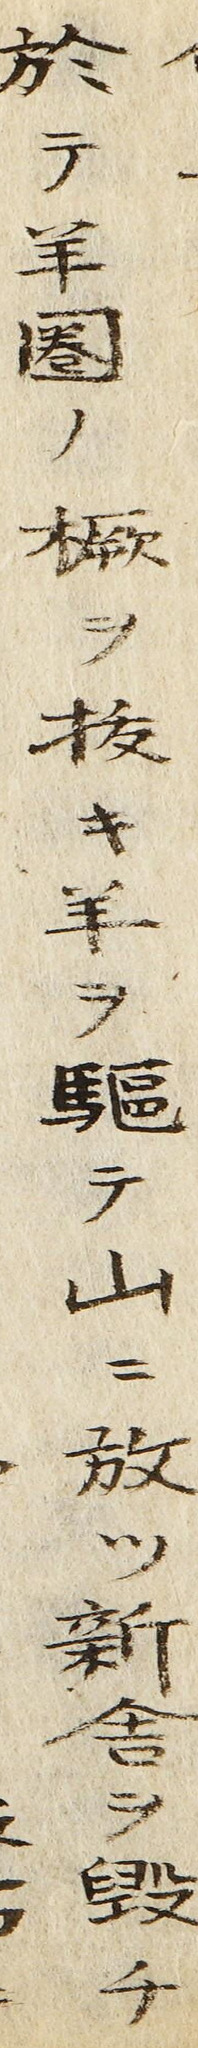於テ羊圏ノ橛ヲ抜キ羊ヲ駆テ山ニ放ツ新舎ヲ毀チ
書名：漂流紀事
